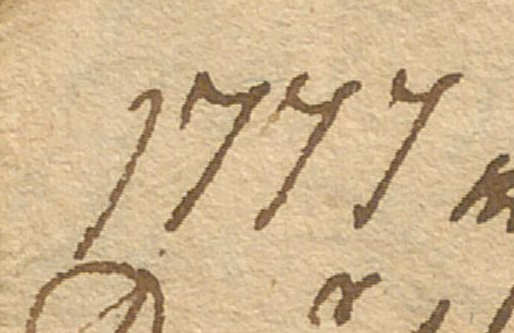1777
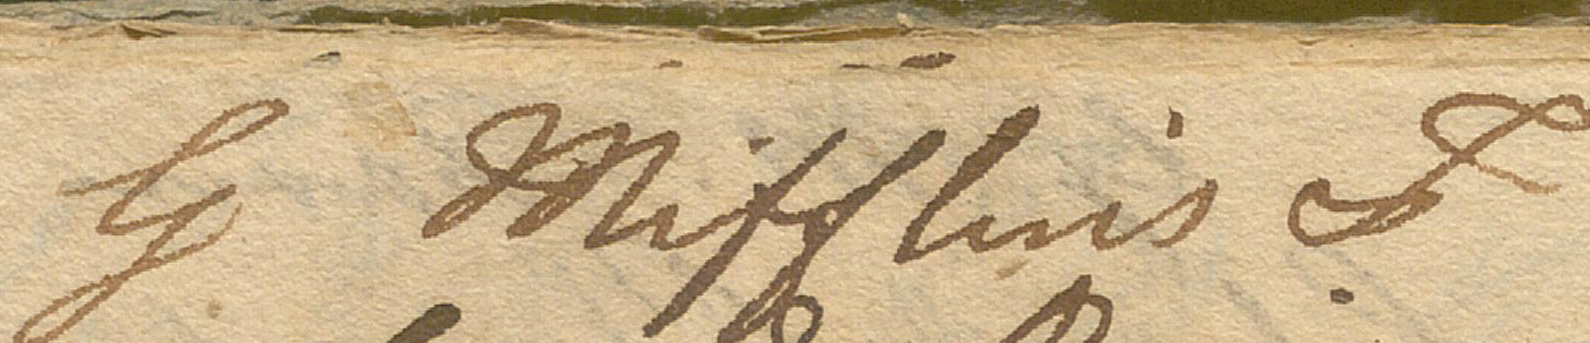G Mifflins F
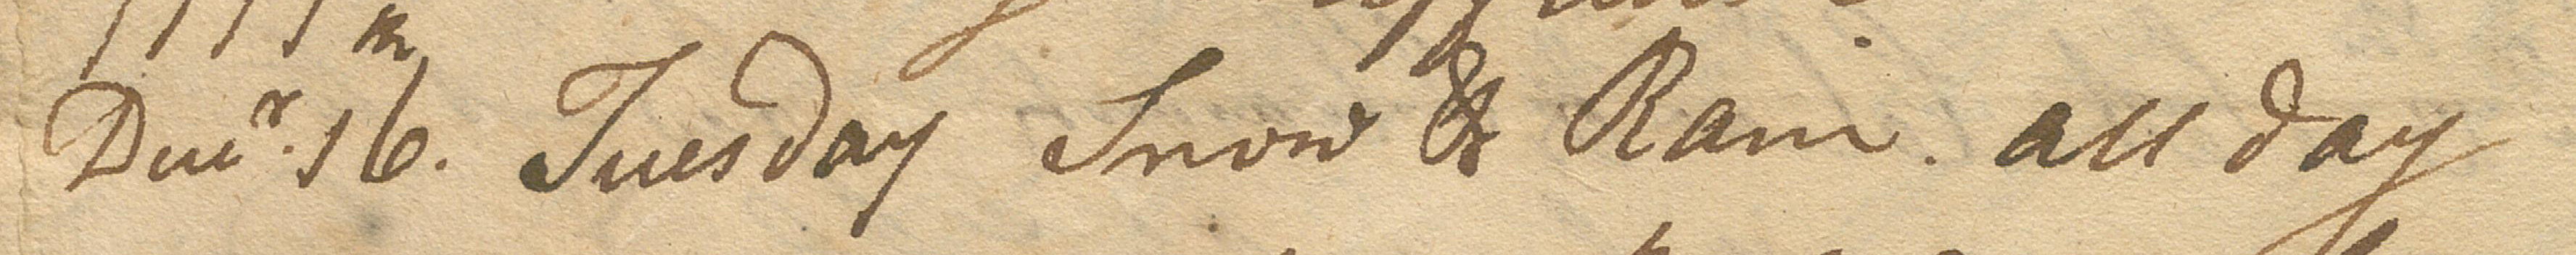Dec^r. 16^th. Tuesday Snow & Rain. all day
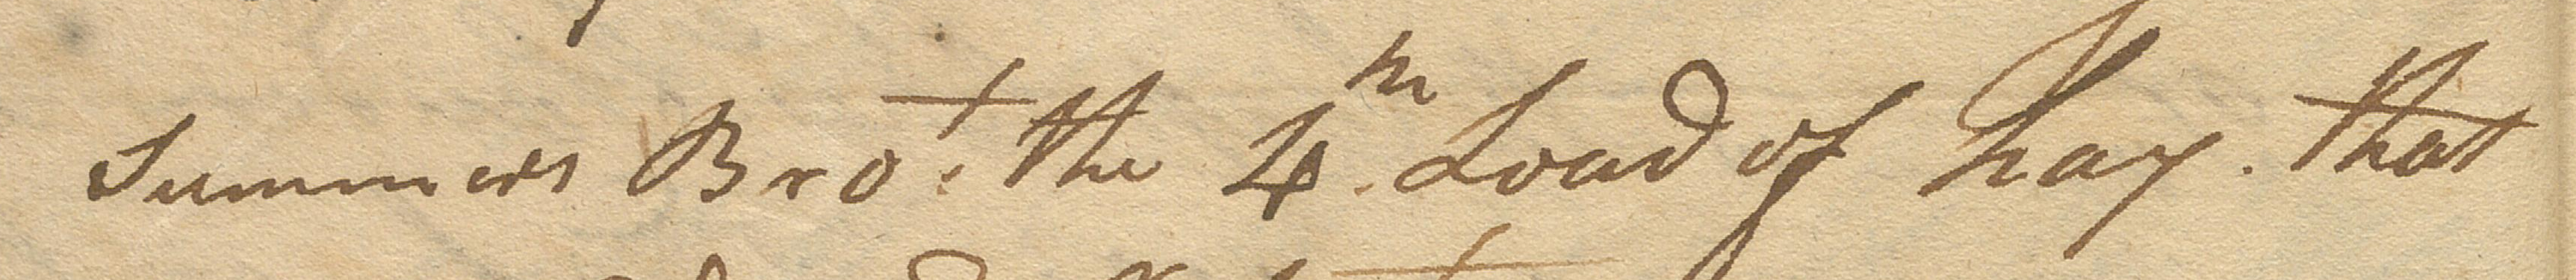Summers Bro^t. the 4^th. Load of hay that
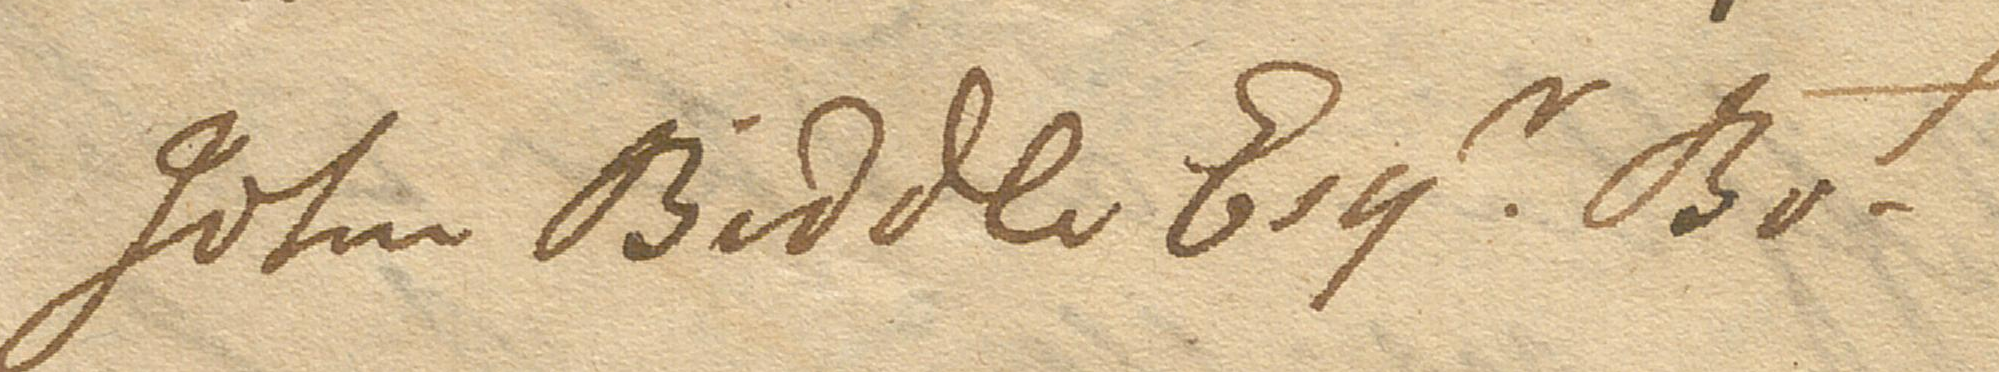John Biddle Esq^r. Bo^t.
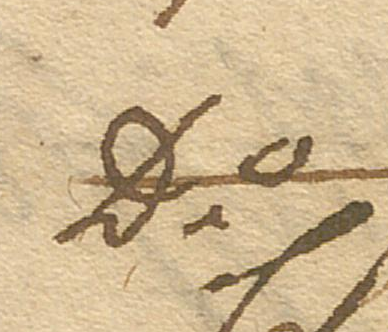D^o.
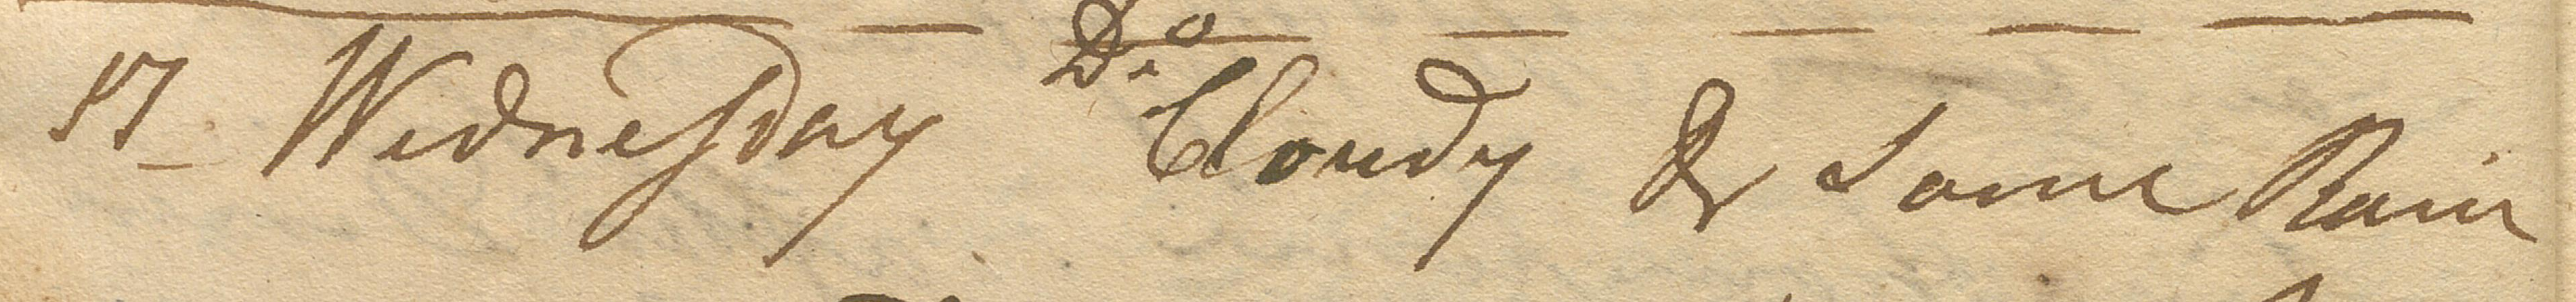17 Wednesday Cloudy & some Rain
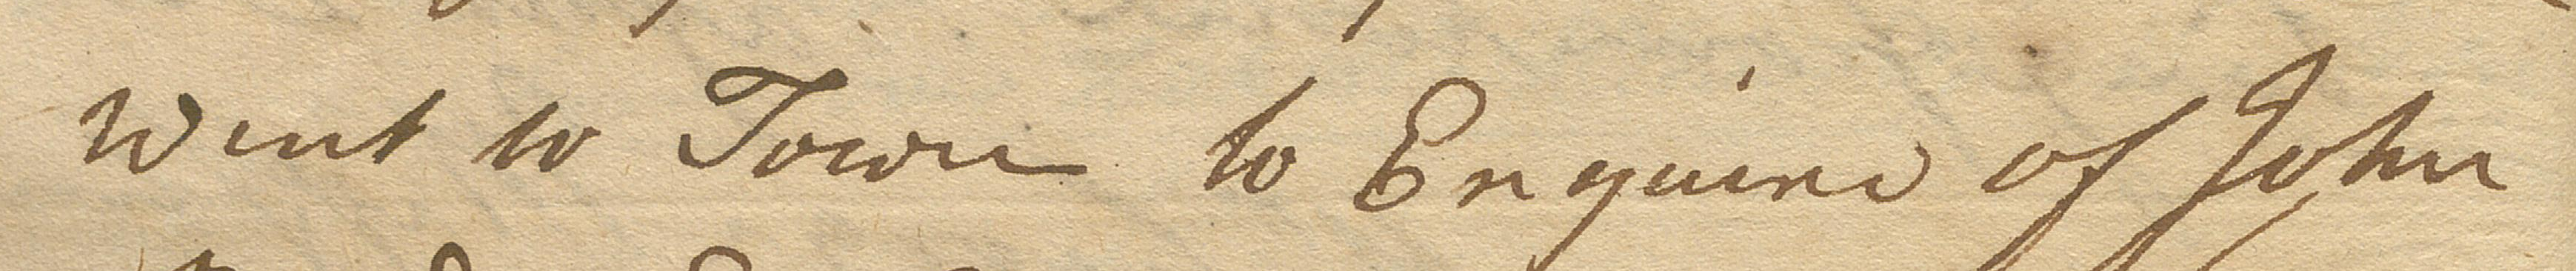went to Town to Enquine of John
